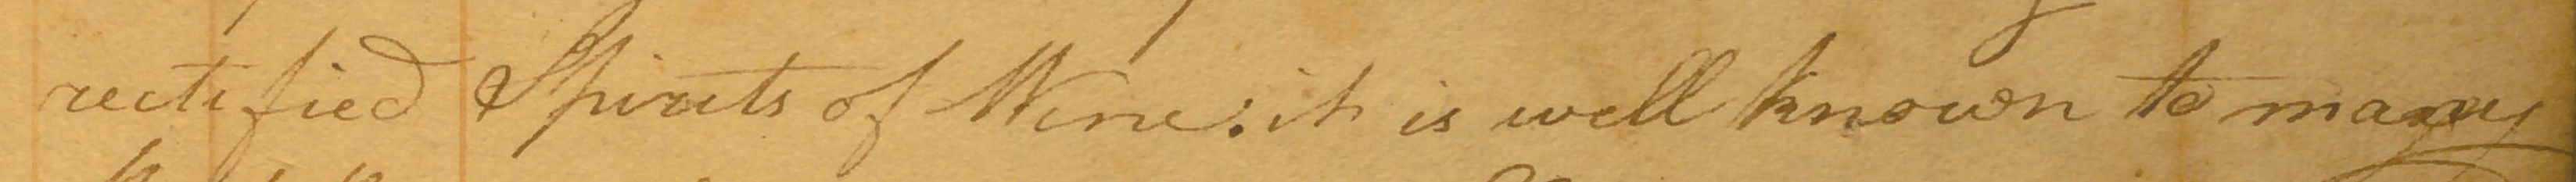rectified Spirits of wine it is well known to many
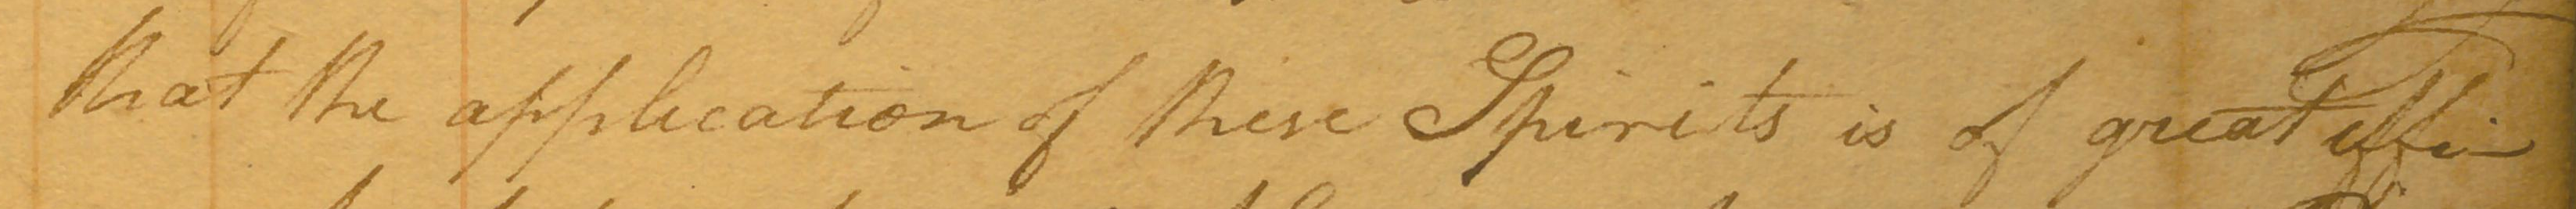that the application of these Spirits if of great effe-
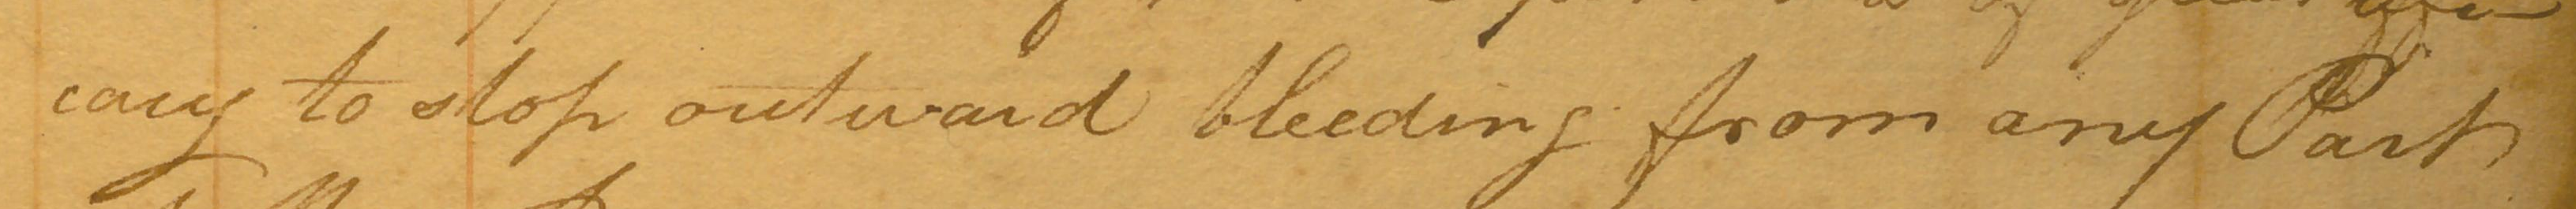cacy to stop outward bleeding from any Part
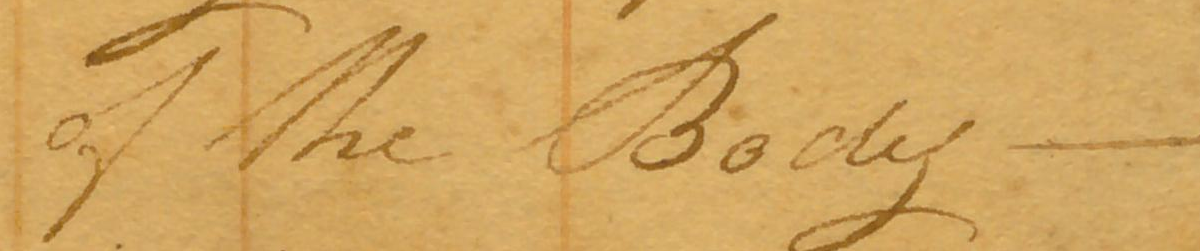of the Body-
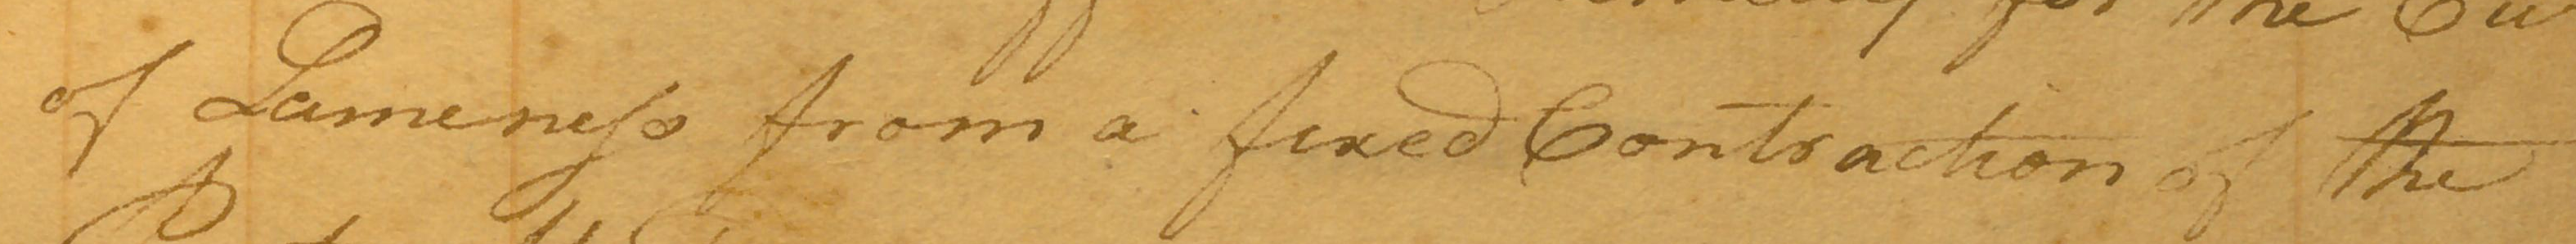of Lameness from a fixed Contraction of the
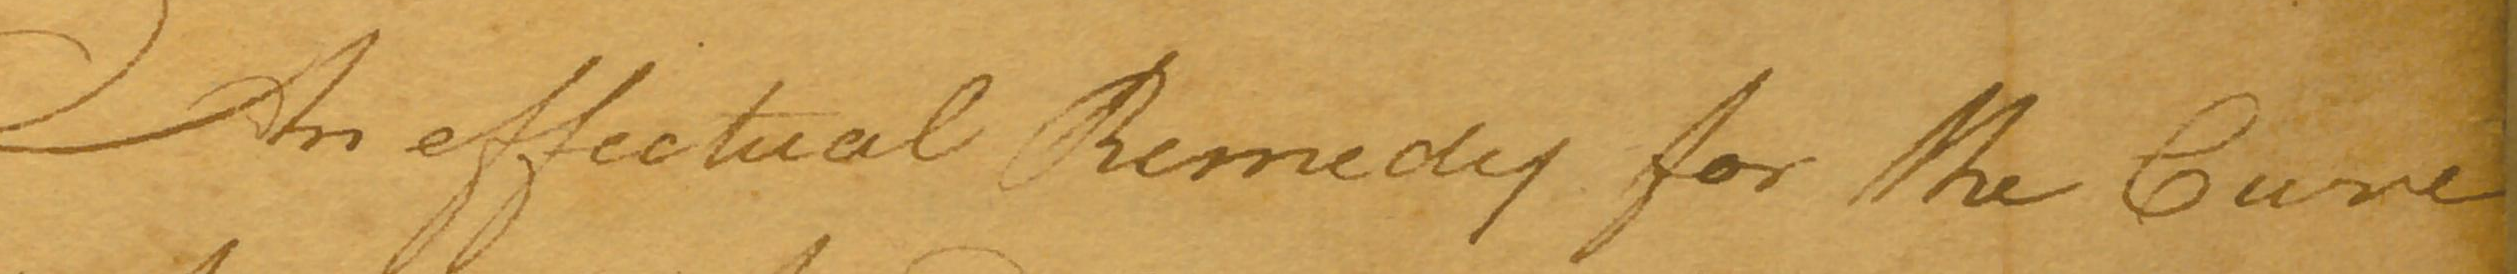An effectual Remedy for the Cure
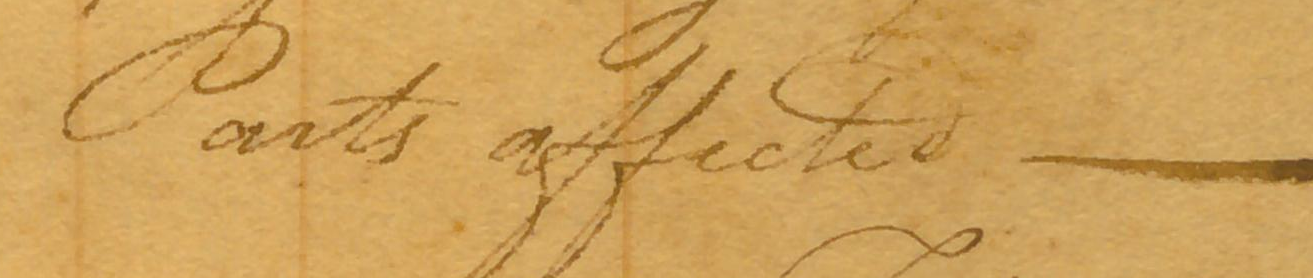Parts affected-
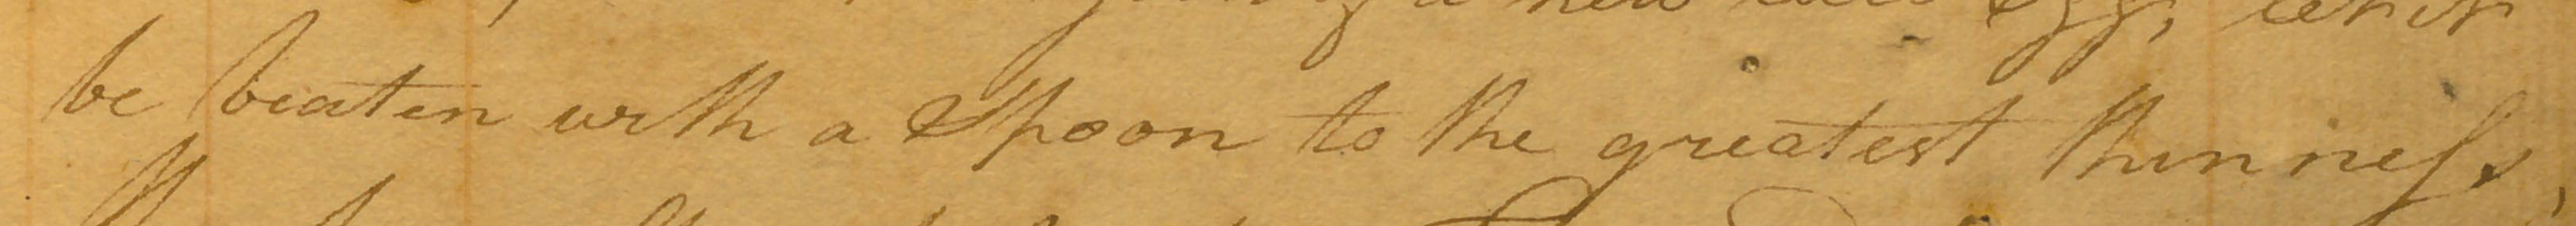be beaten with a spoon to the greatest thinness,
